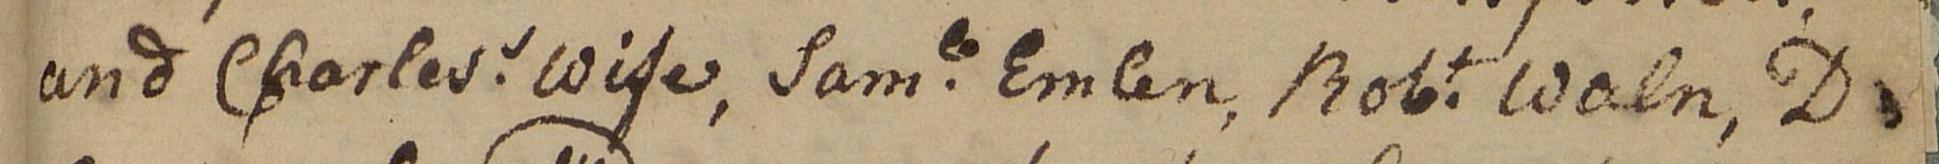and Charles^s. Wife, Sam^l. Emlen, Rob^t Waln, D
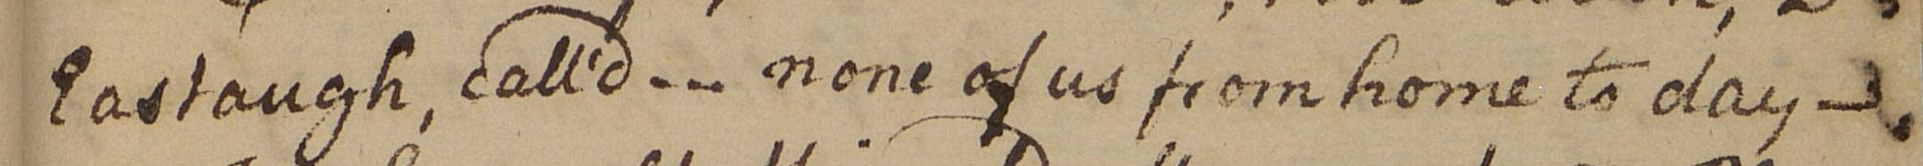Eastaugh, call'd- none of us from home to day-
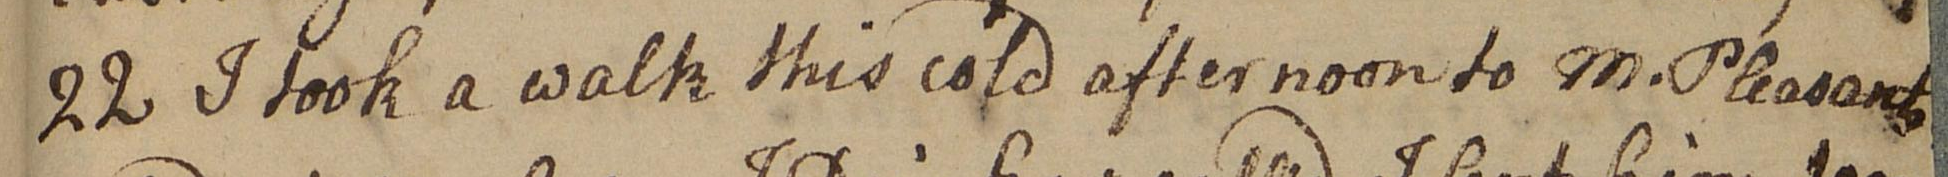22 I took a walk this cold afternoon to M. Pleasants
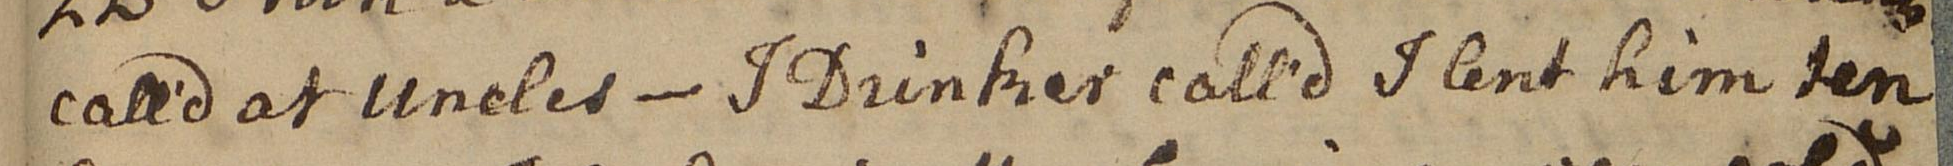call'd at Uncles- I Drinker call'd I lent him ten
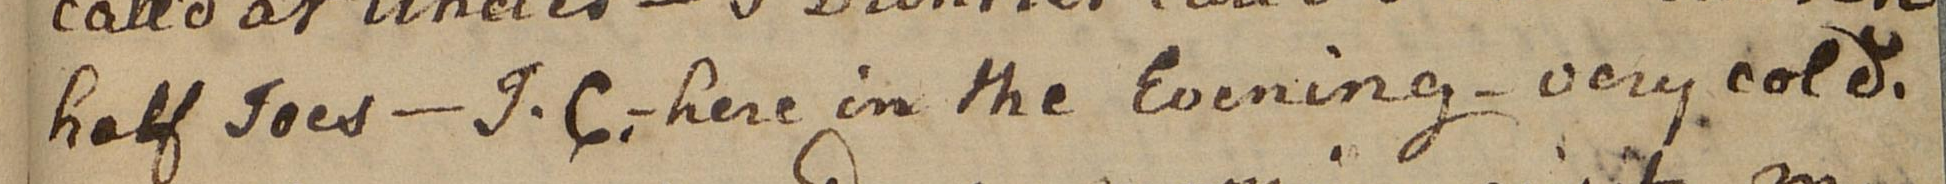half Joes- I. C. -here in the Evening- very cold.
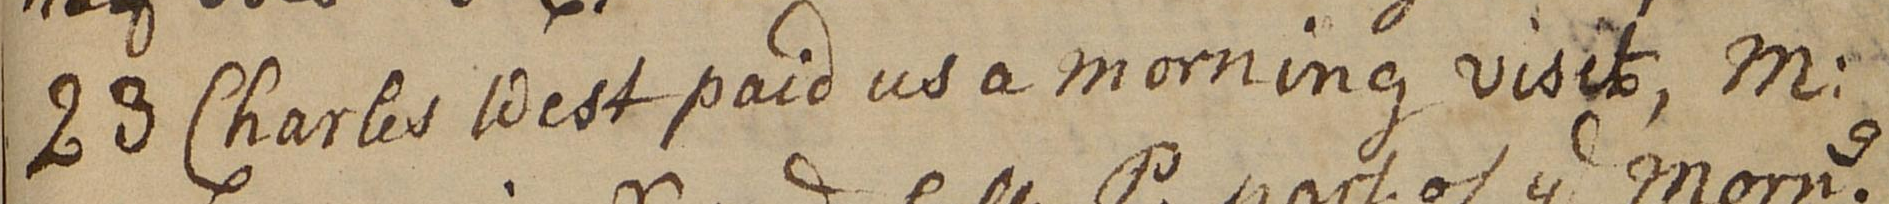23 Charles West paid us a morning visit, M:
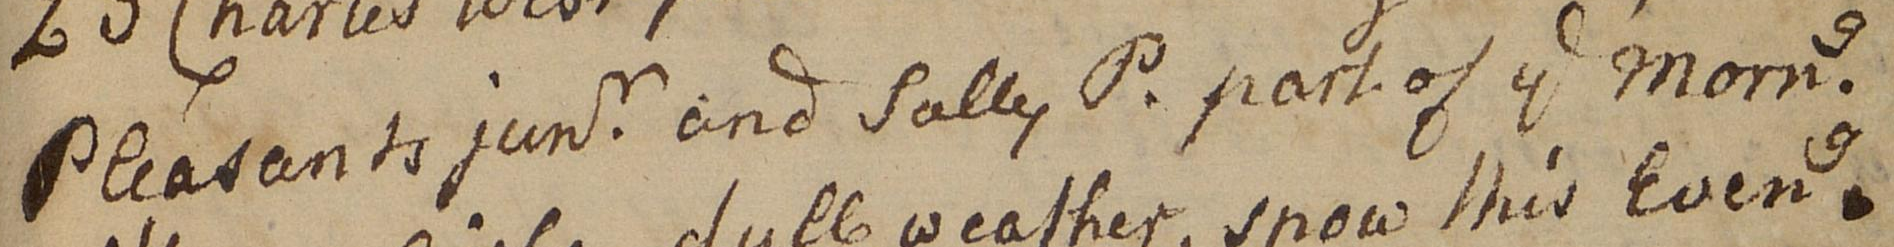Pleasants jun^r. and Sally P. part of y^e morn^g.
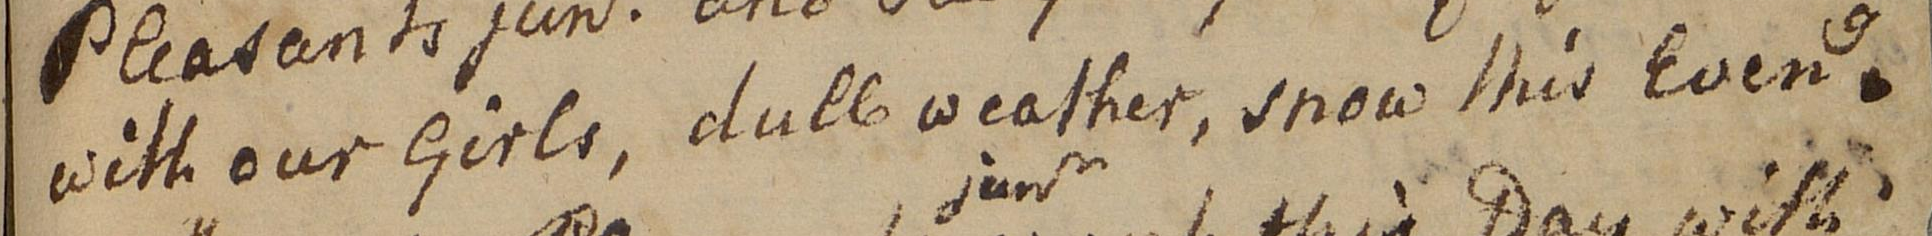with our Girls, dull weather, snow this Even^g.
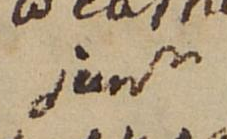jun^r
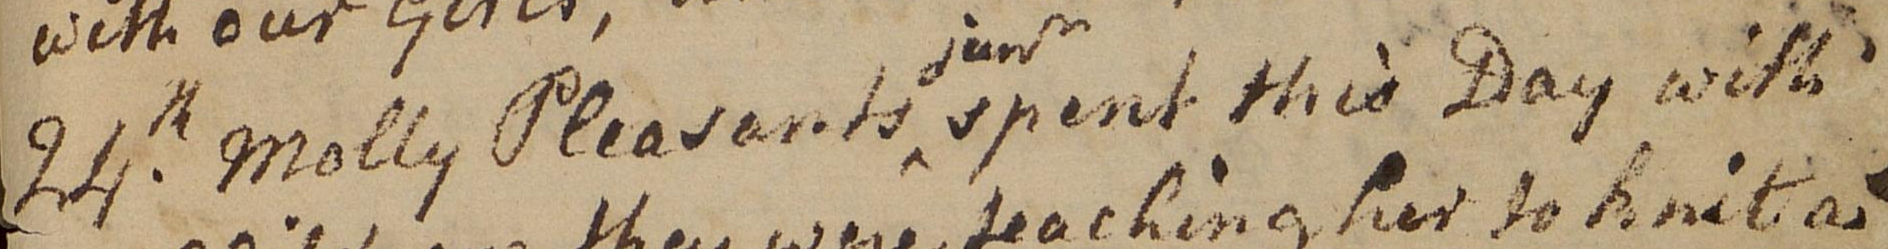24^th. Molly Pleasants ^ spent this Day with
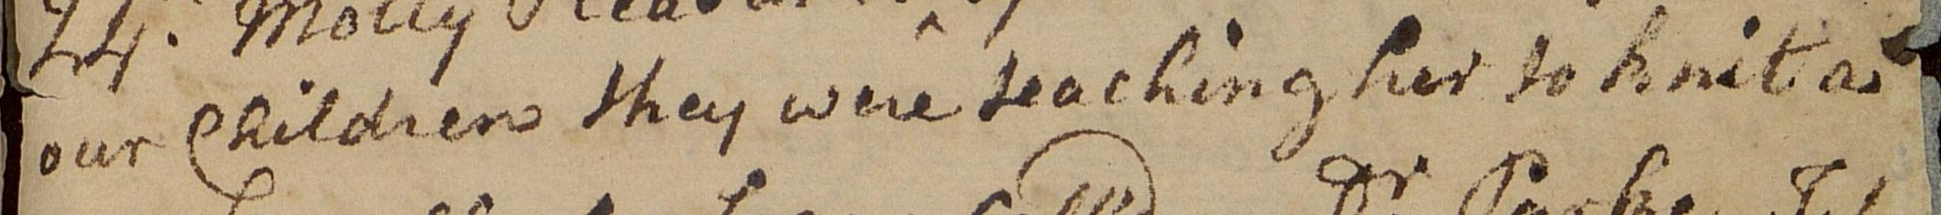our Children they were teaching her to knit a
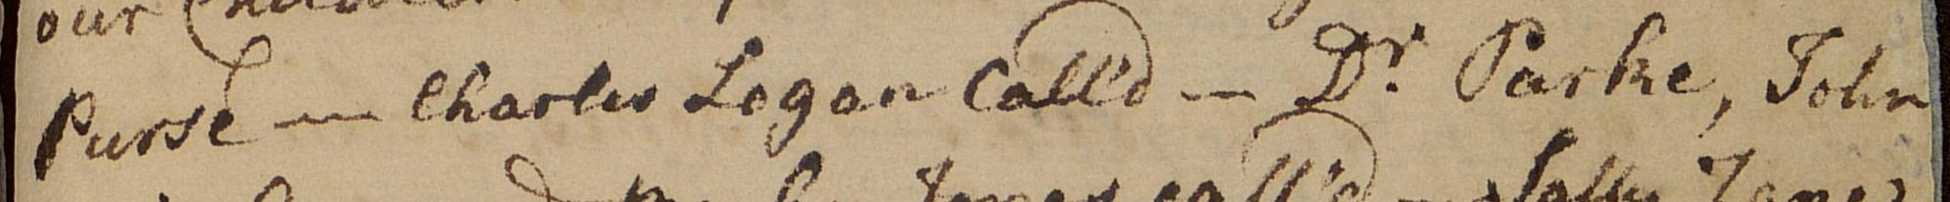Purse- Charles Logan Call'd- D^r. Parke, John
